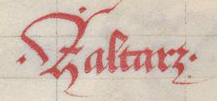.Żaltarz.
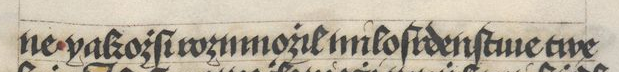ne.yakożſi rozmnożil miloſrdenſtuie twe
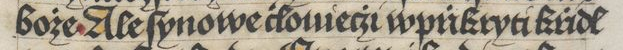boże.Ale ſynowé ċlouiecżi wpṙikryti kṙídl
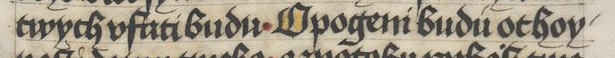twych vſati budu.Opogeni budu ot hoy¬
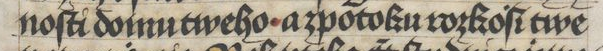noſti domu tweho.a zpotoku rozkoẛi twe
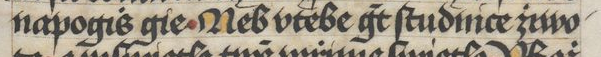napogiš gie.Neb vtebe ḡt ſtudnice żiwo¬
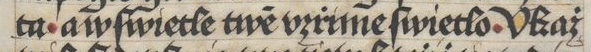ta.a w ſwietle twē vzṙíme ſwietlo.Vkaż
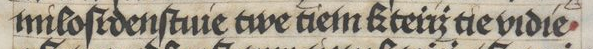miloſrdenſtuie twe tiem kteṙíż tie vidíe.
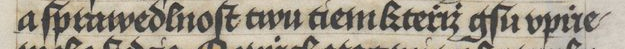a ſprawedlnoſt twu tiem kteṙiż gſu vpṙie¬
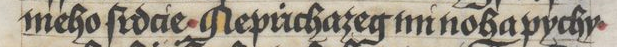meho ſrdcie.Nepṙichazeg mi noha pychy.
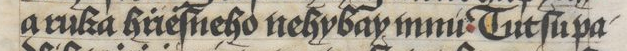a ruka hṙieẛneho nehybay mnú.Tut ſu pa¬
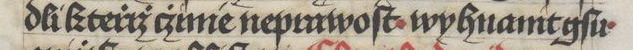dli kteṙíż cżiníe neprawoſt.wyhnanit gſu.
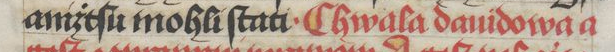aníżtſu mohli ſtati.Chwala dauidowa a
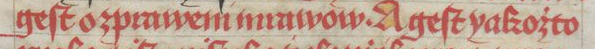geſt ozprawení mrawow.A geſt yakożto
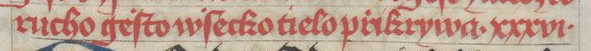rucho geẛto wẛecko tielo pṙikrywa.xxxvi.
